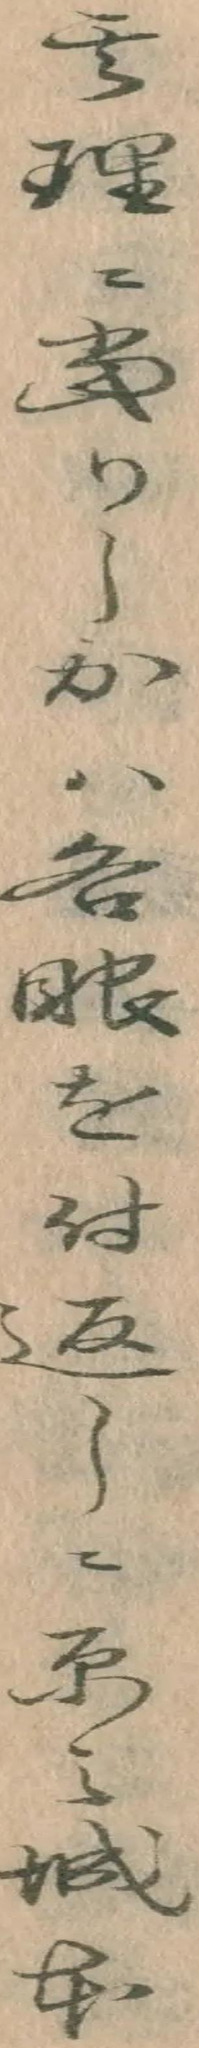其理に当りしかは各眼を付返しに原之城本
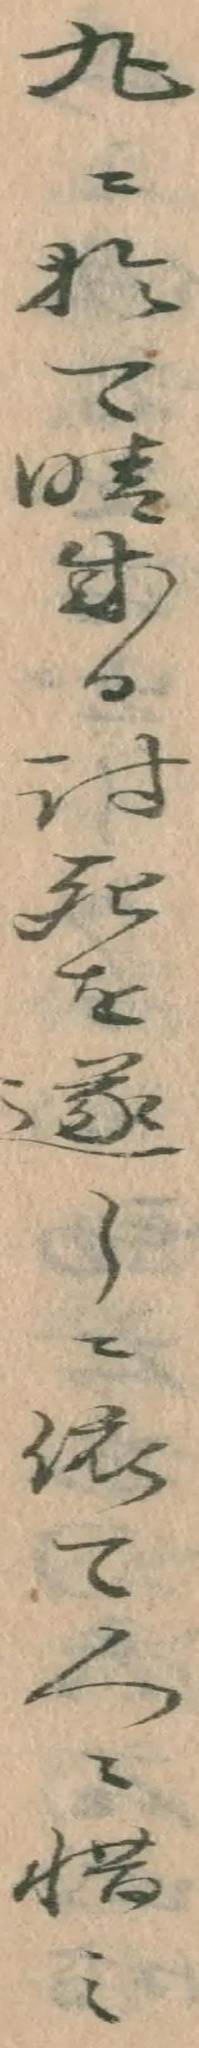丸に於て晴成る討死を遂しに依て人に惜之
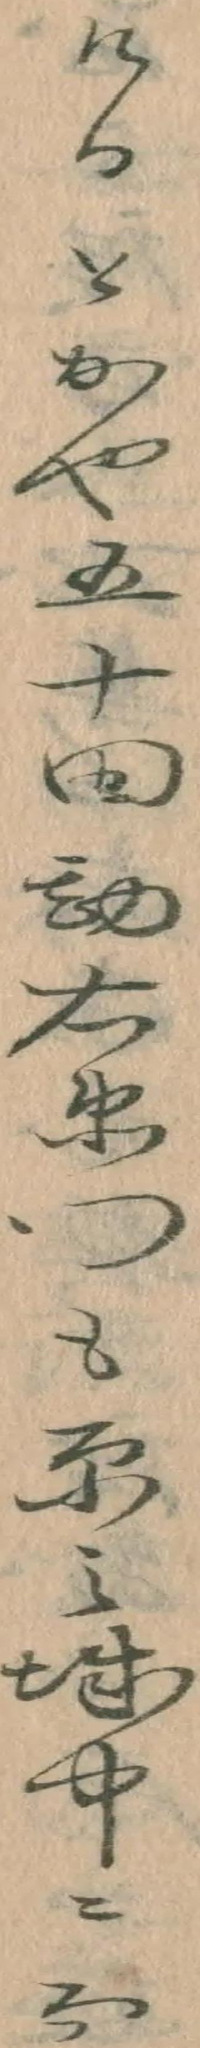けるとかや五十田勘右衛門も原之城中に而
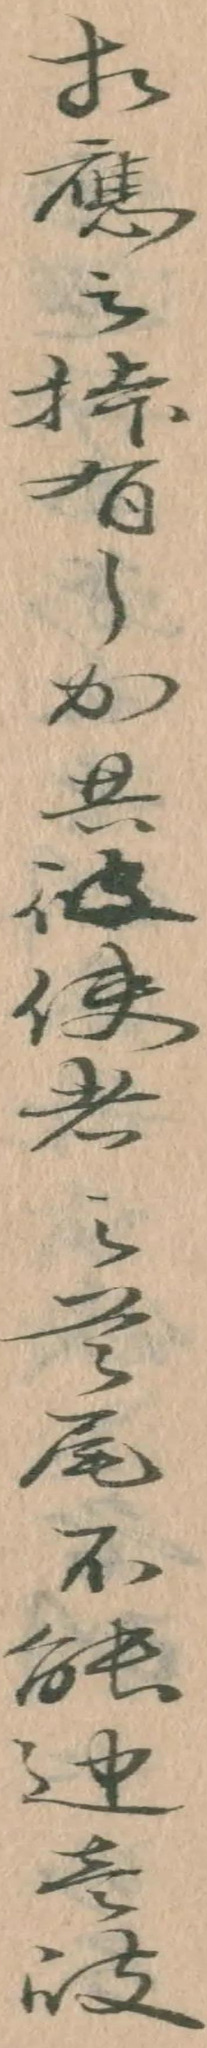相応の挊有しか共彼使者之首尾不能迚壱岐
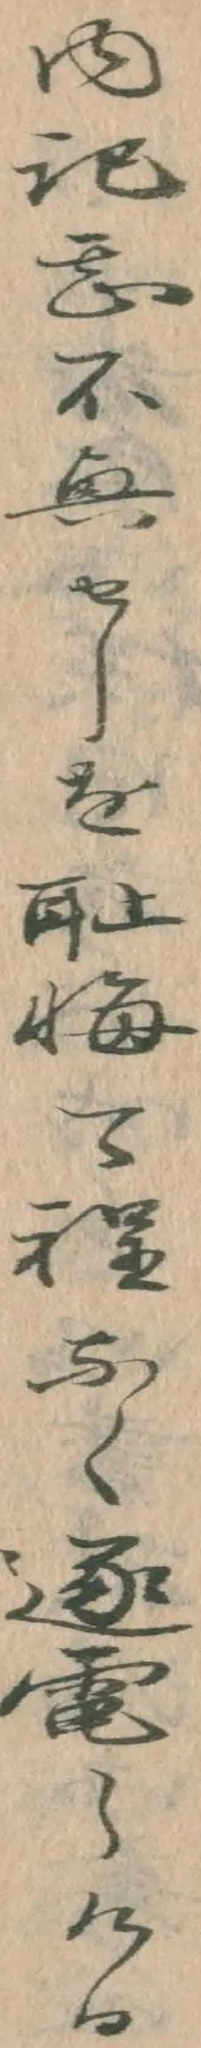内記甚不與せしを恥悔て程なく遂電しける
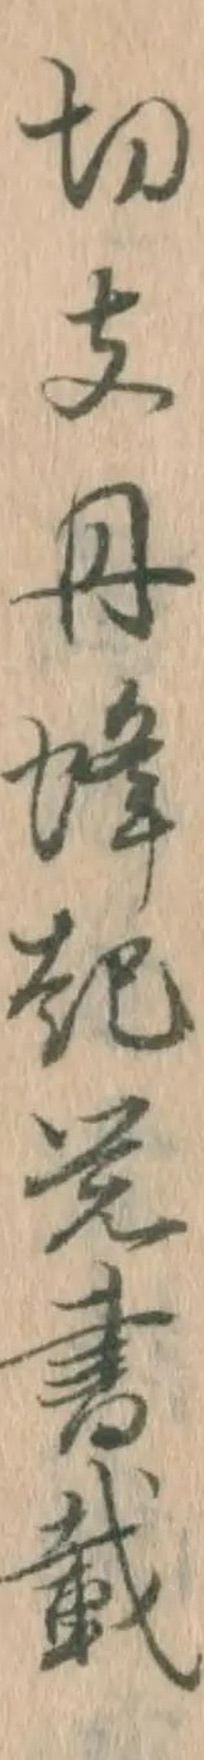切支丹蜂起覚書載
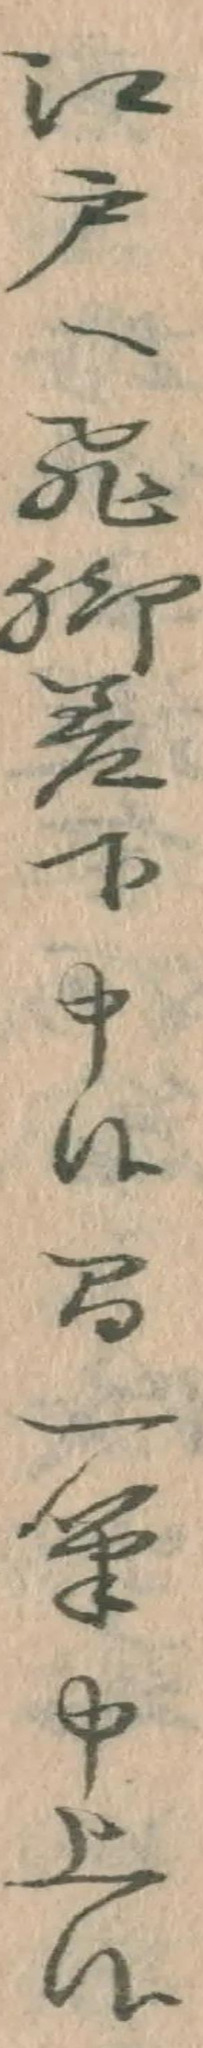江戸へ飛脚差下申候間一筆申上候
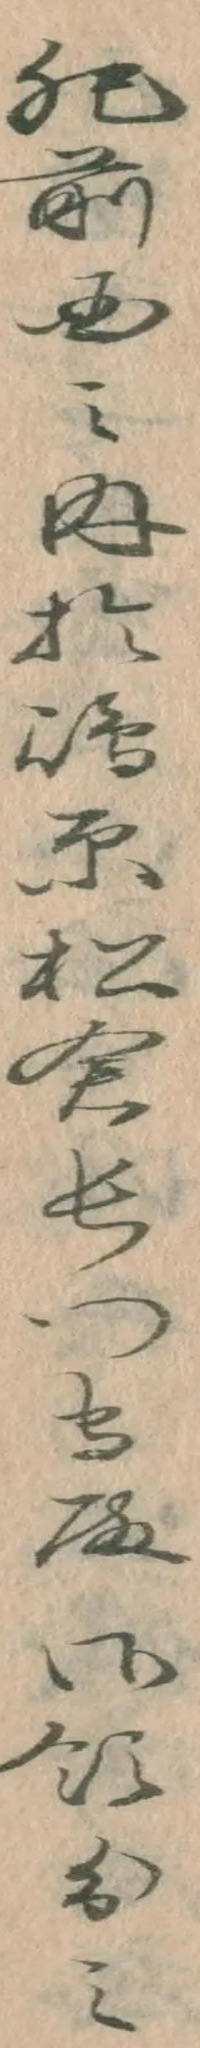一肥前国之内於島原松倉長門守殿御領分之
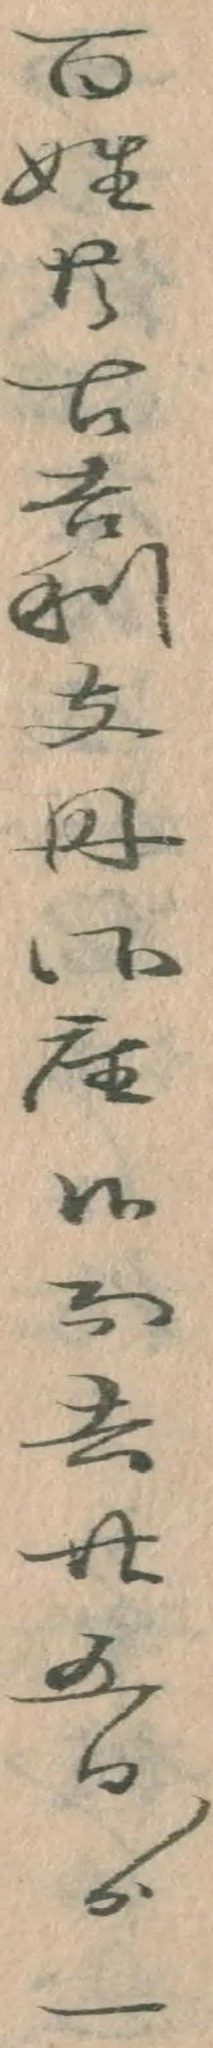百姓共古吉利支丹御座候而去廿五日ゟ一
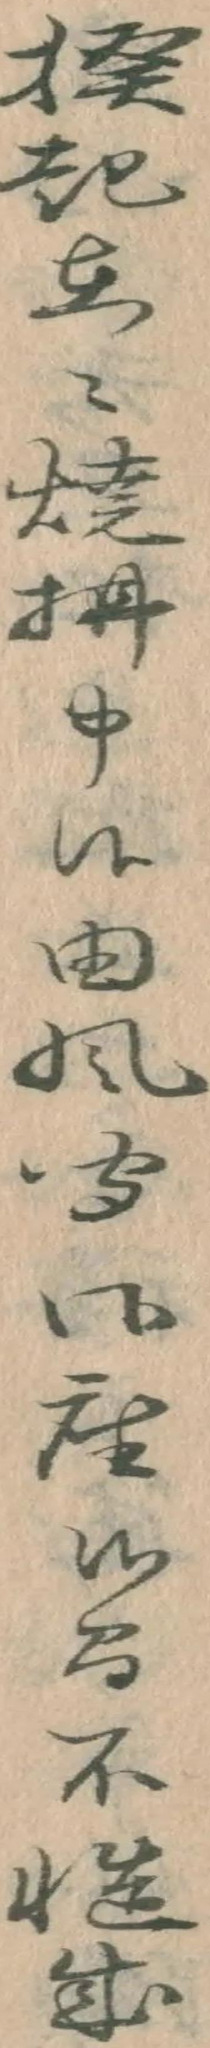揆起在々焼払申候由風聞御座候間不慥成
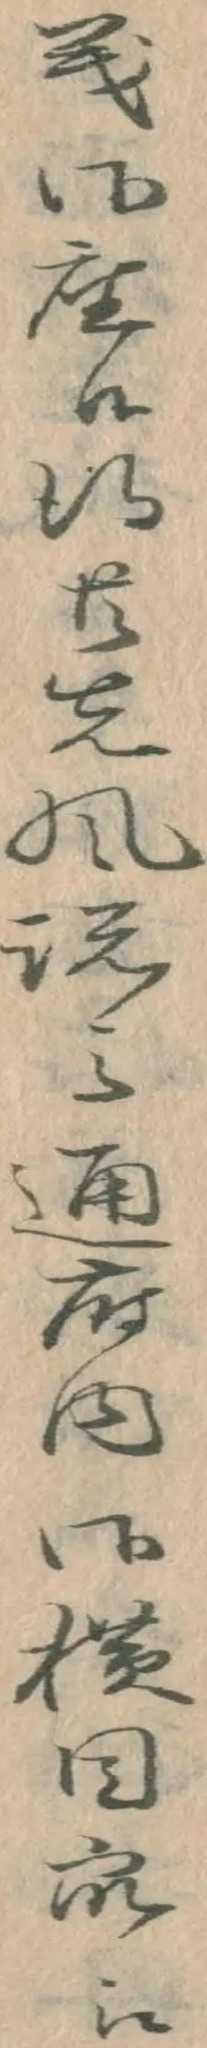義御座候得共先風説之通府内御横目衆江
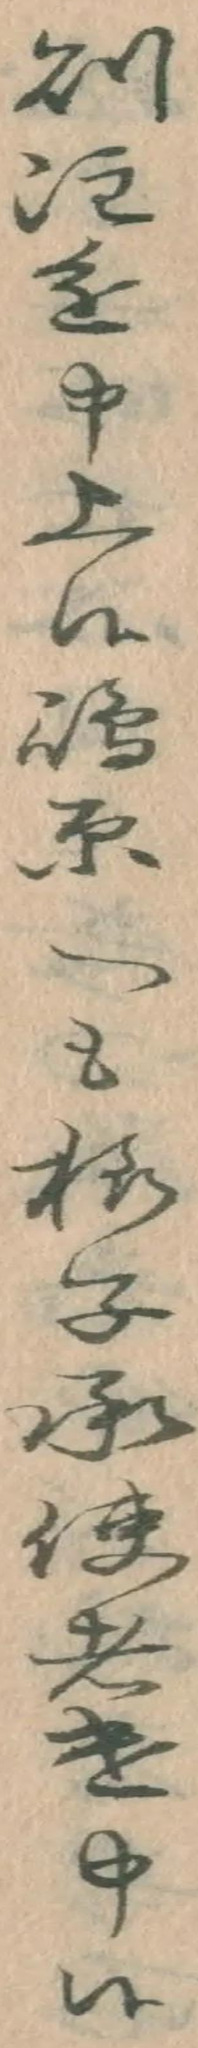則注進申上候島原へも様子承使者遣申候

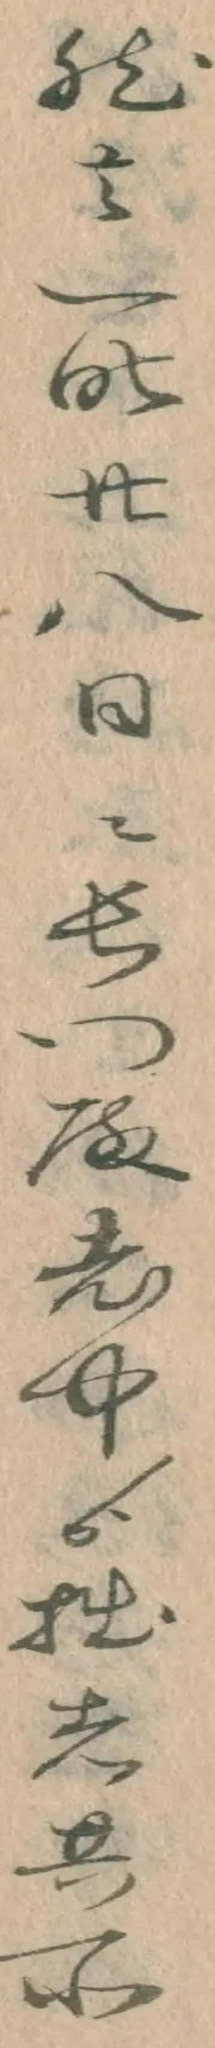然者一時廿八日に長門殿老中ゟ拙者共所
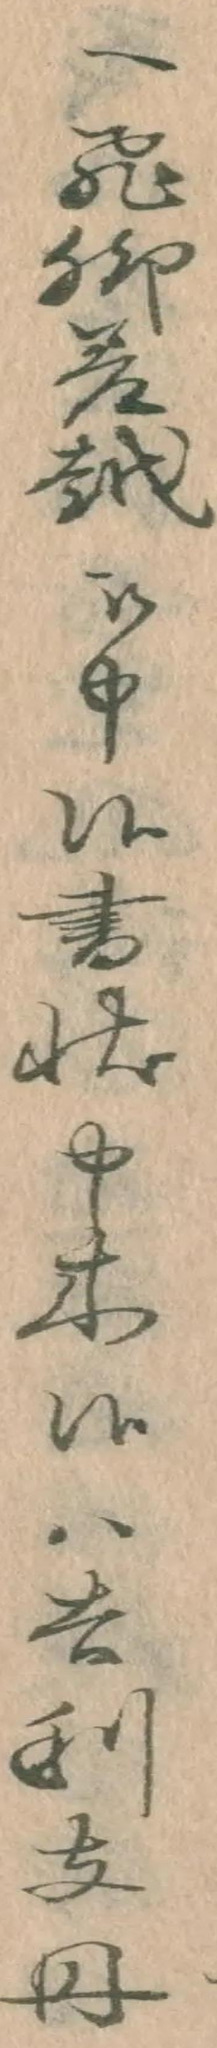へ飛脚差越被申候書状申来候は吉利支丹
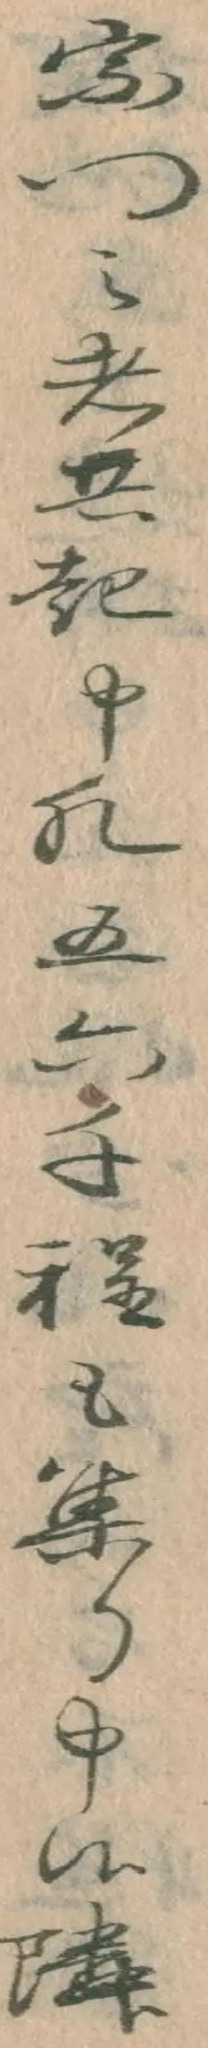宗門之者共起申凡五六千程も集り申候隣
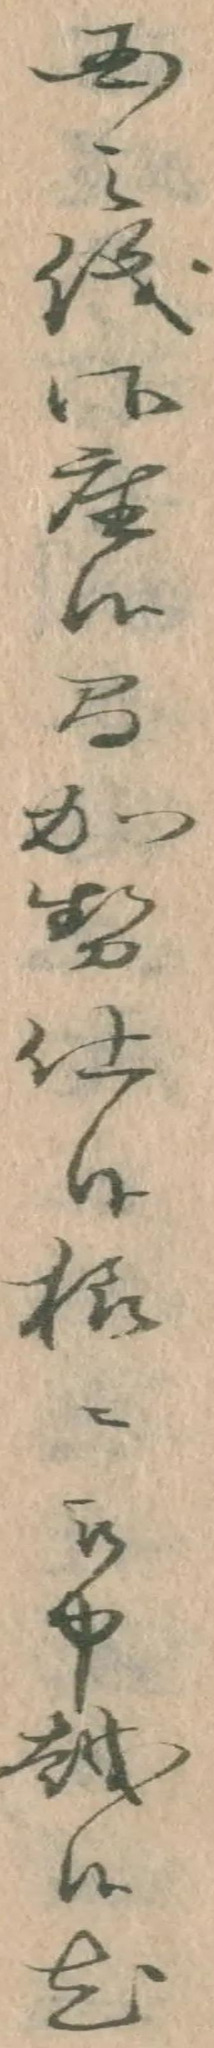国之儀御座候間加勢仕候様に被申越候尤
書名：切支丹御退治記 49巻. [2]
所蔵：国立国会図書館 National Diet Library, JAPAN
